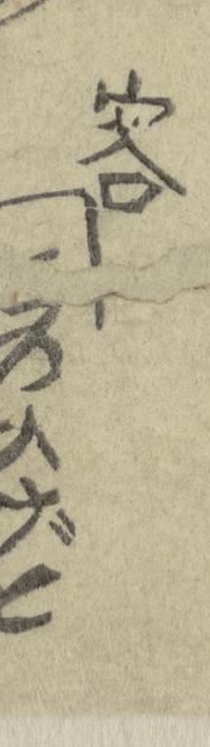〽そ？のひげを
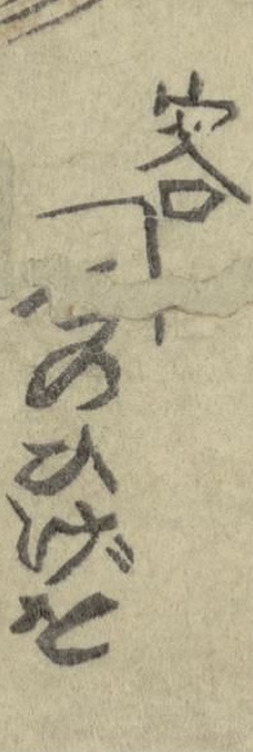〽そ？のひげを
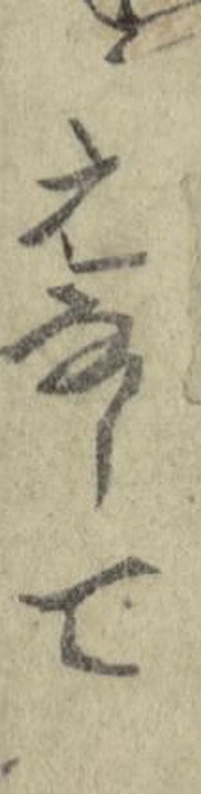はなして
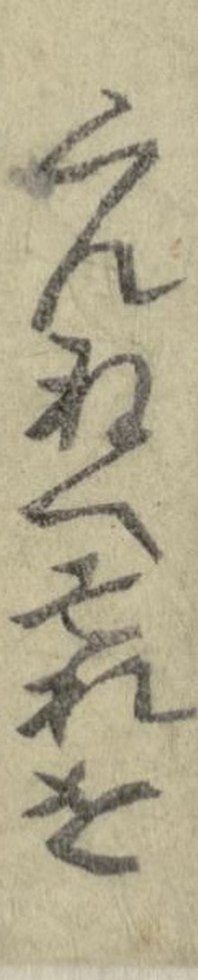くんねへそれを
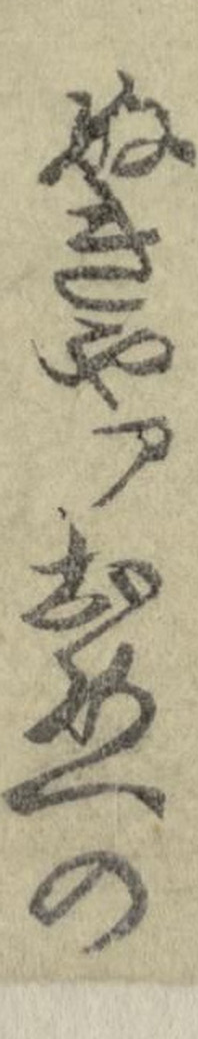ぬきやァおめへの
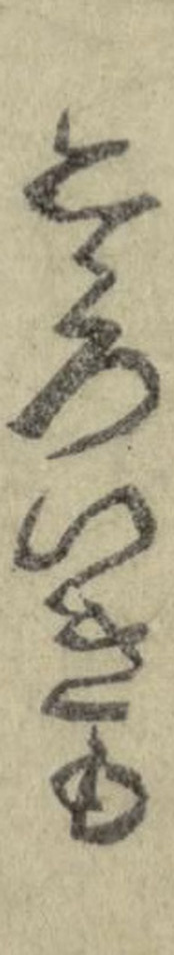こゝろいきも
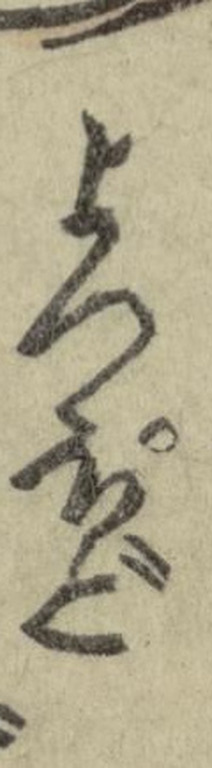よつぽど
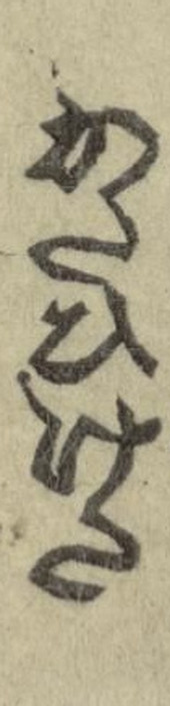かたひげた
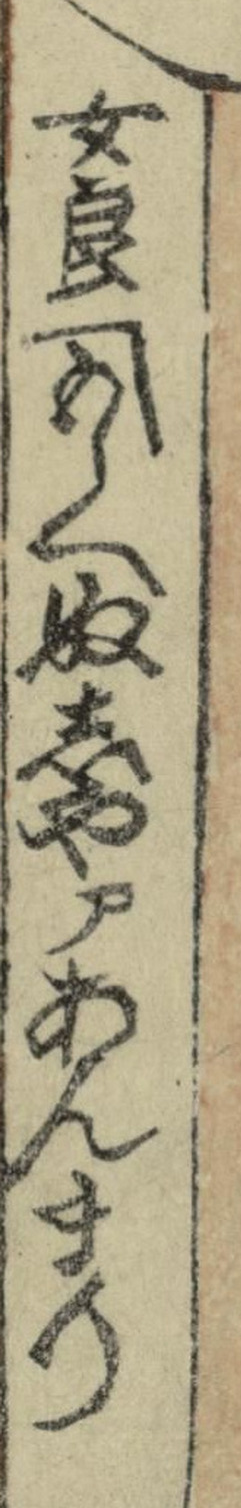女良〽もしへぬしやァあんまり
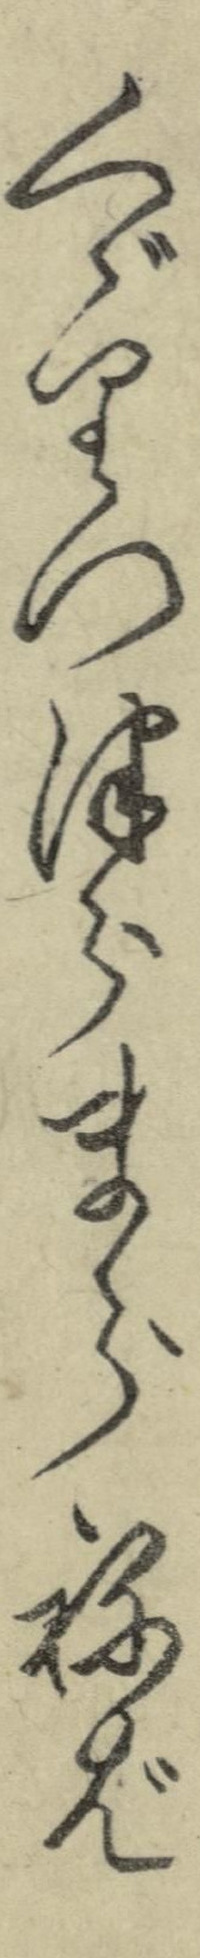くゞりつつらまらねば
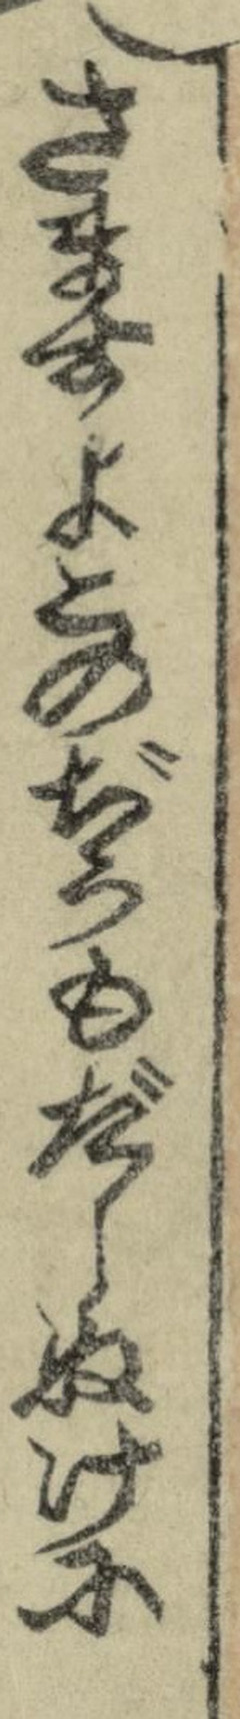さますよとのぢうもだしぬけに
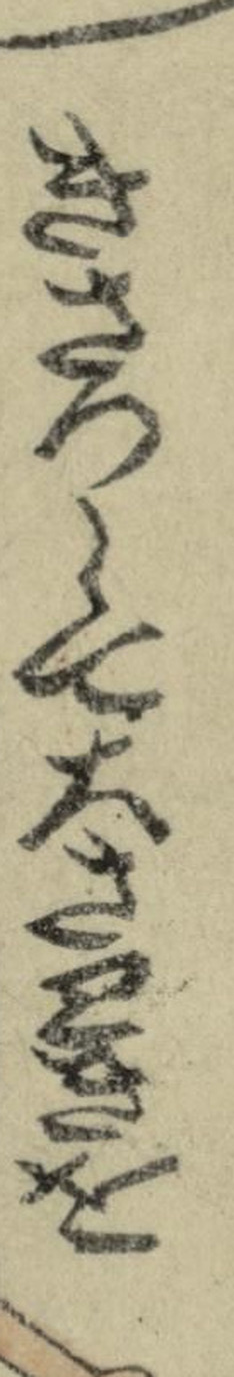きさつして大さはきを
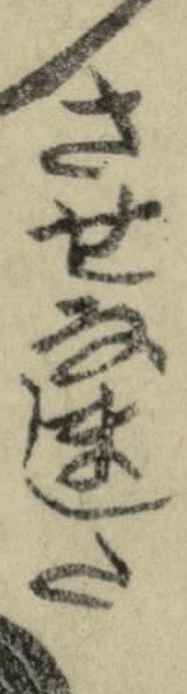させなました
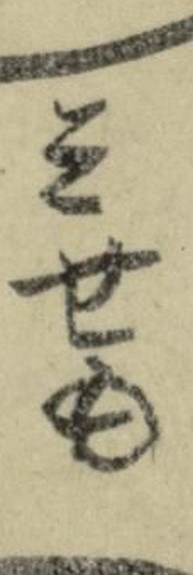みせも
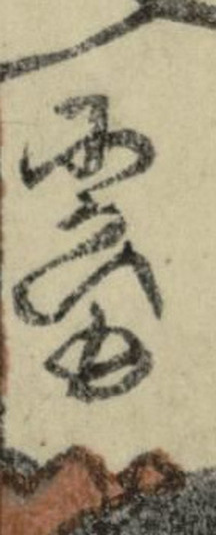にかいも
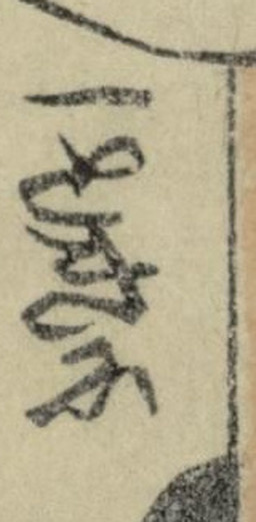一ときに
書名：治る御代　ひやかし鯰
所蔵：東京大学地震研究所図書室 Earthquake Research Institute Library, The University of Tokyo, JAPAN
